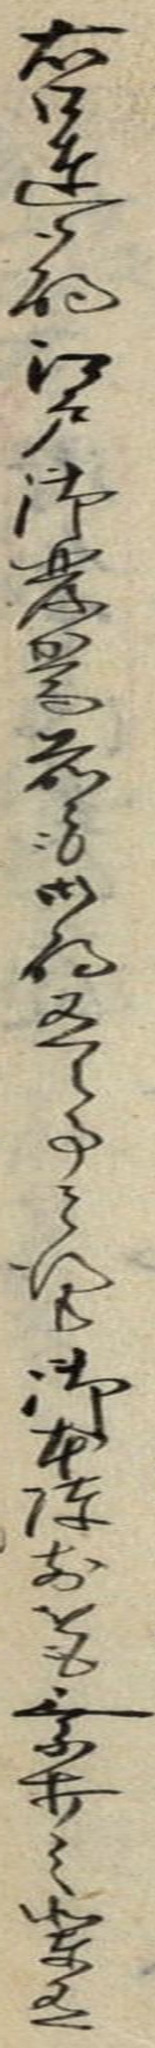右口達御触江戸御発駕前にも御触有之事に候得共御本陣前をも乗打之輩有
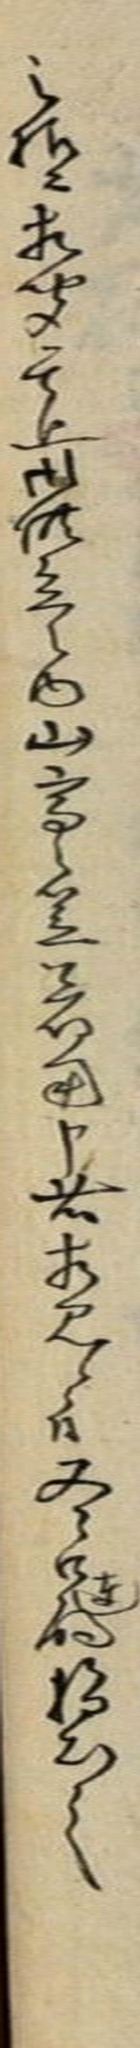之様に相聞其上御供立之内山高之笠着用申者相見候に付又々口達触指出之
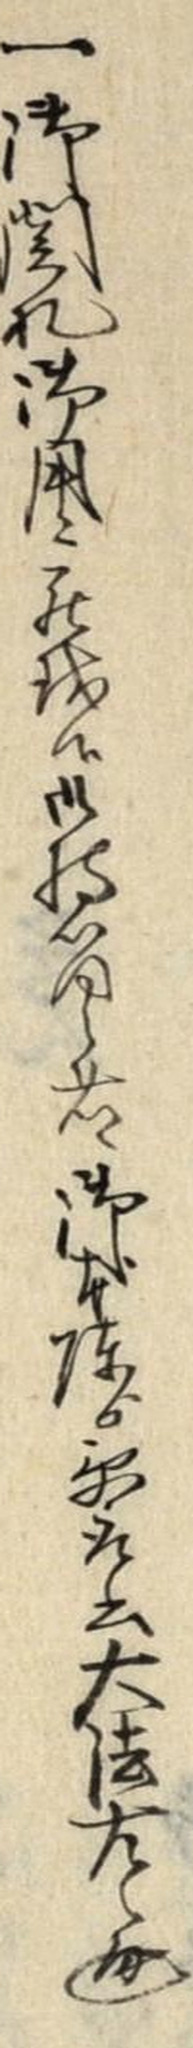一御関札御用に罷越候御持筒之者へ御本陣ゟ受取書大法左之通
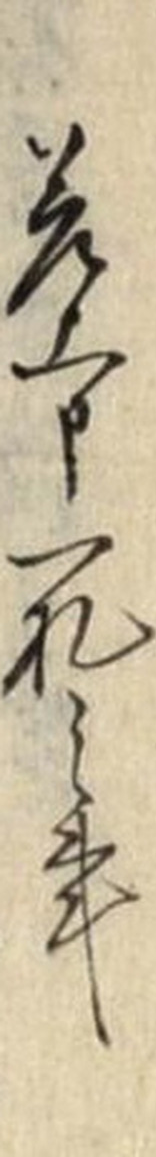差上申一札之事
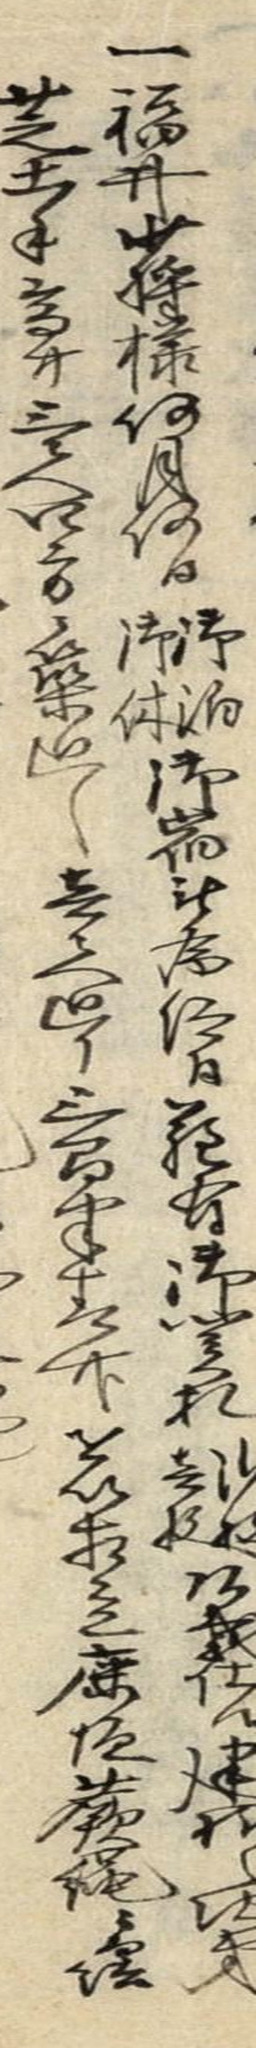芝土手高さ三尺四方に築廻し壱尺廻り三間半青竹を以相立鹿垣蕨縄にて結
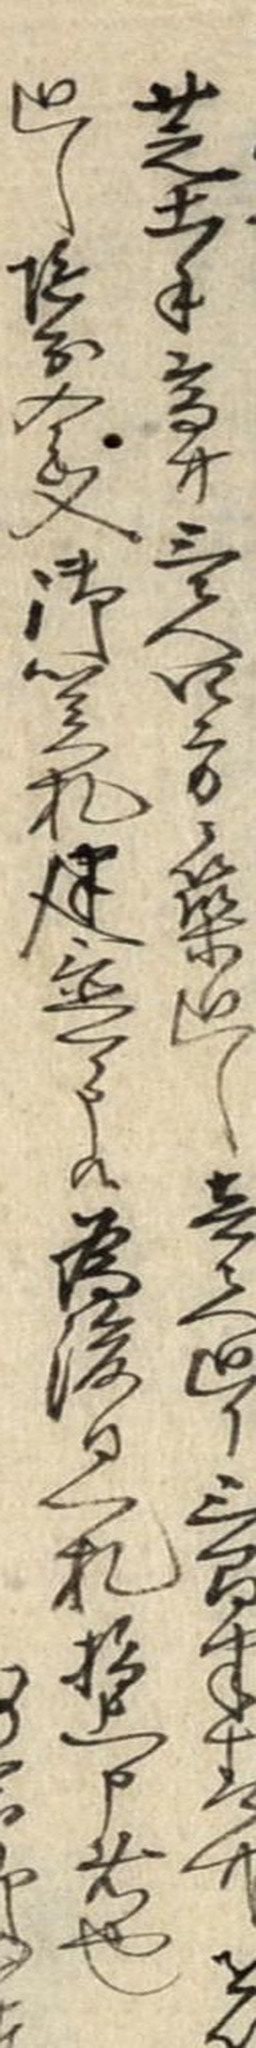廻し随分念入御関札建置可申候為後日一札指上申者也
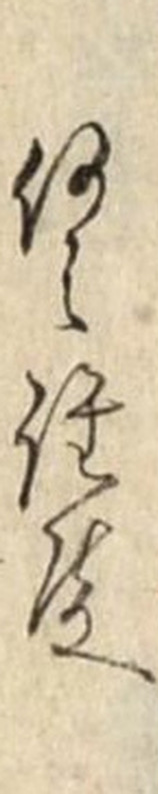何之誰殿
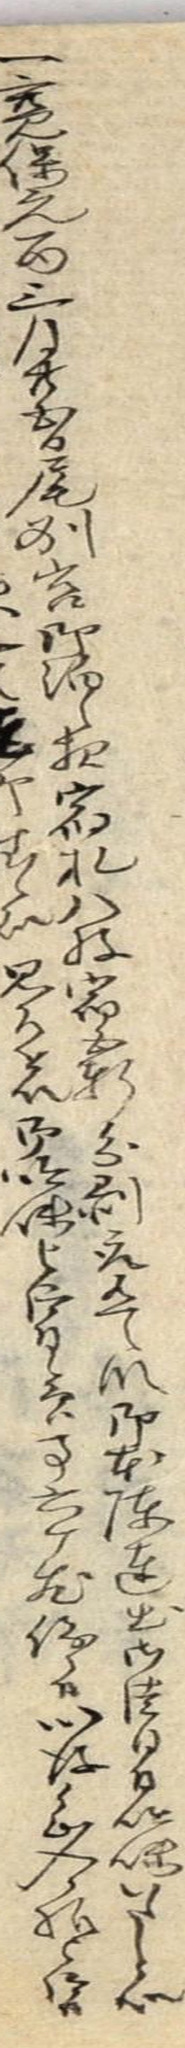一寛保元酉三月廿五日尾州宮御泊之夜宿札八枚宿五軒分剥取有之段御本陣達出御徒目付吟味いたし候処
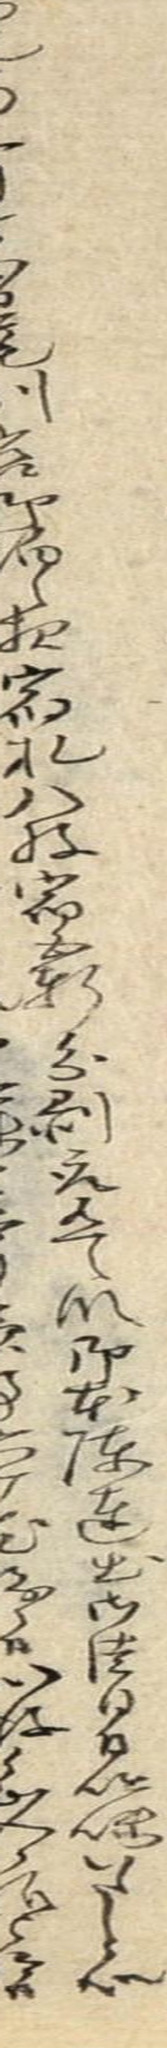一寛保元酉三月廿五日尾州宮御泊之夜宿札八枚宿五軒分剥取有之段御本陣達出御徒目付吟味いたし候処
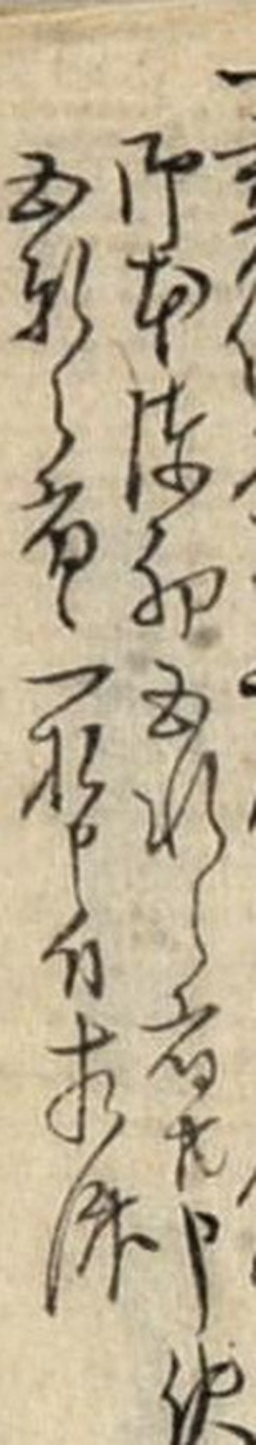五軒之者へ一札申付相済

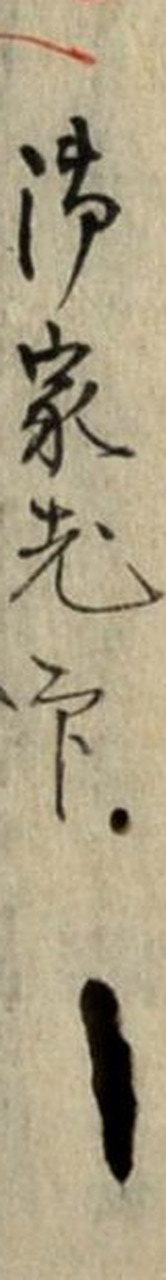御家老印
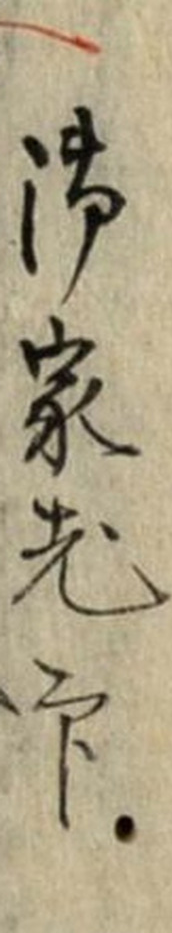御家老印
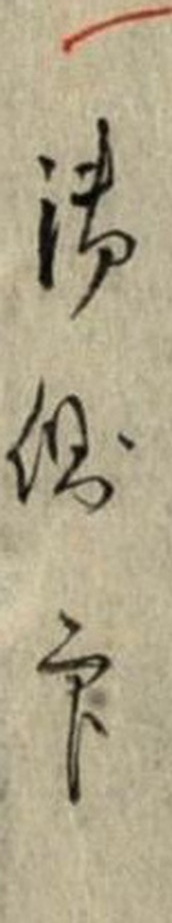御側印
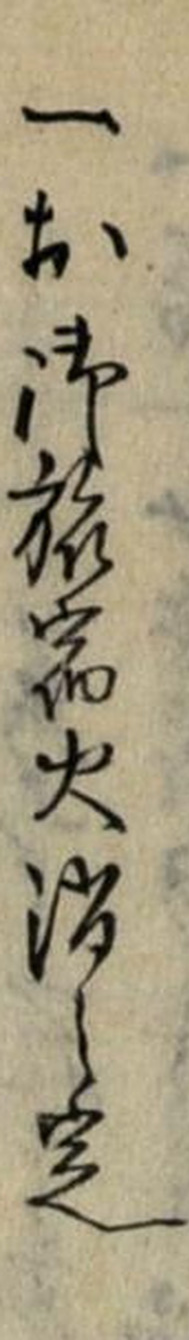一於御旅宿火消之定
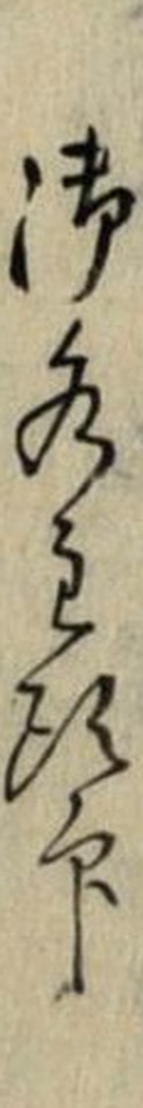御水主頭印
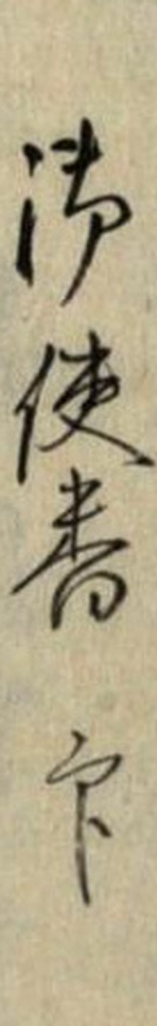御使番印
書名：三都并道中之部
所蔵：福井県文書館 Fukui Prefectural Archives
